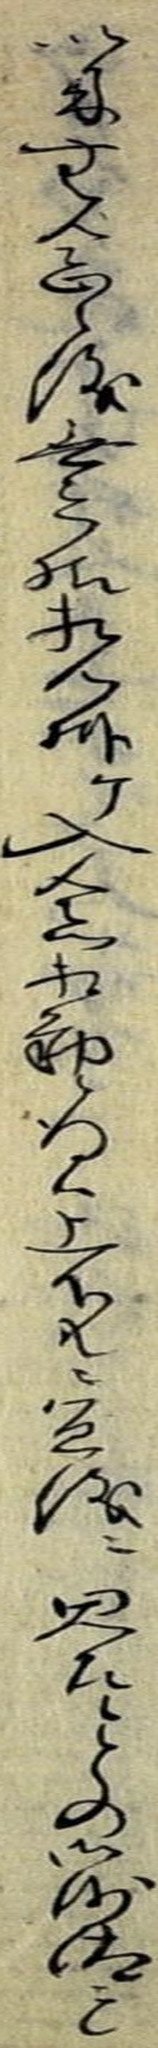以来無念之儀無之様相心掛ケ入念相勤候得ハ上下共ニ宜儀ニ思召候との御沙汰ニ候
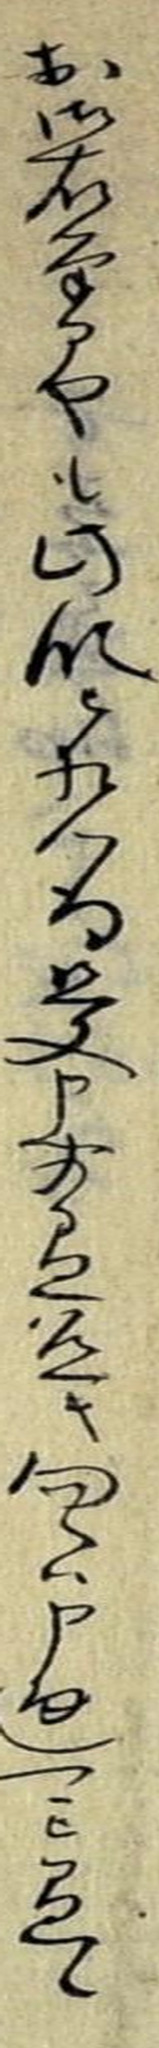於御右筆部屋も此段被相心得且又申聞置宜キ向ヘハ申通可被置候
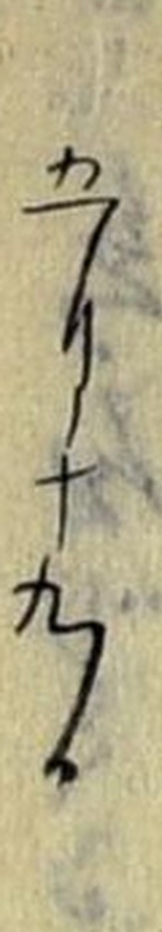五月十九日
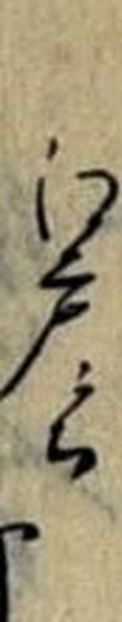江戸ニ而
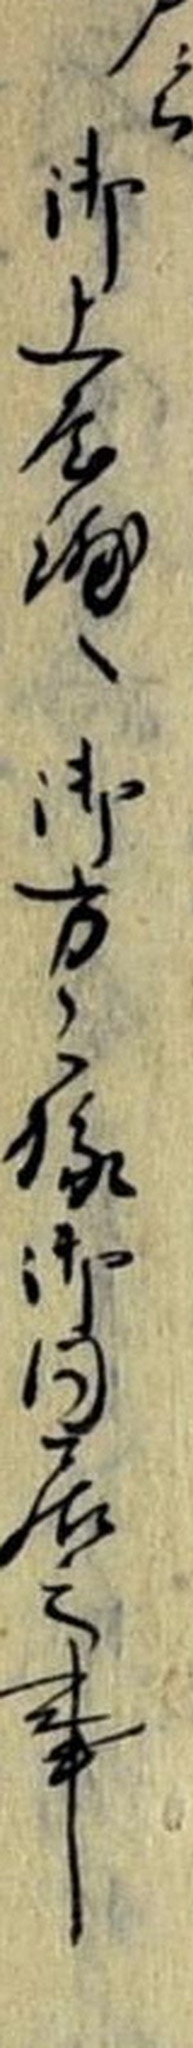御上屋鋪へ御方々様御同居之事
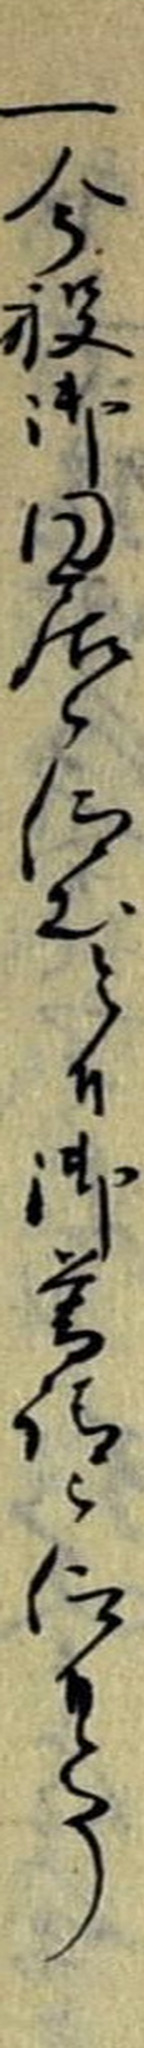一今般御同居被仰出候ニ付御普請被仰付候事
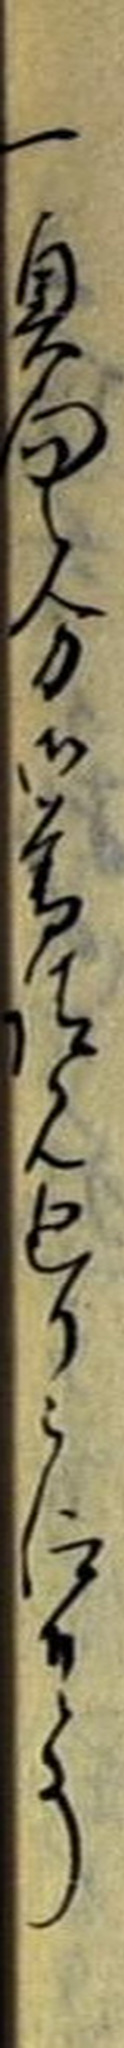一奥向之分御普請見廻り被仰付候事
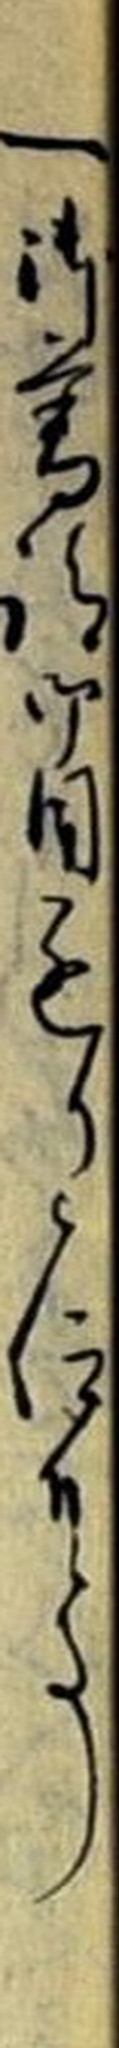一御普請御用懸り被仰付候事
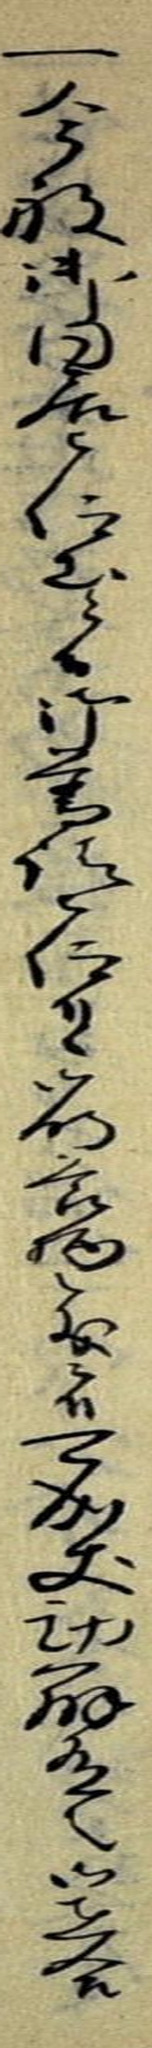一今般御同居被仰出候ニ付御普請被仰付候御時節柄之義ニ付可成丈勘弁有之御在合
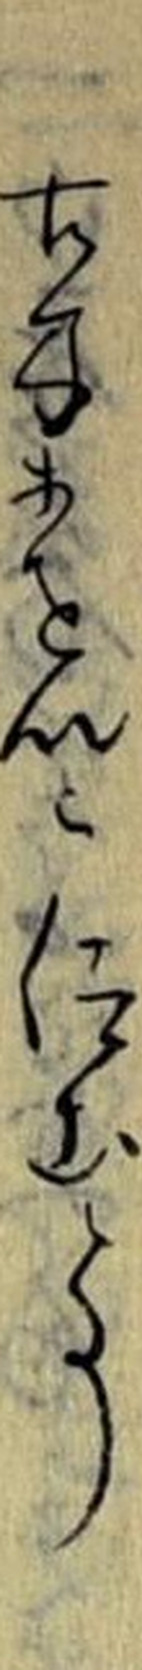古来等を以被仰出候事
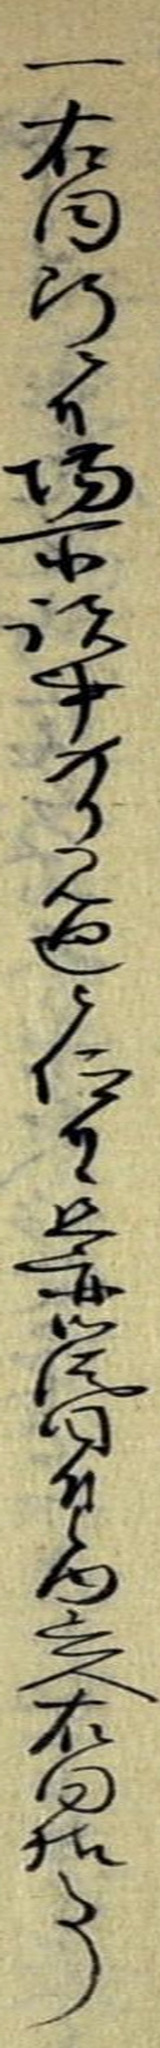一右同断ニ付場所諸事〆り見廻被仰付候且亦御徒目付之内壱人右同様事
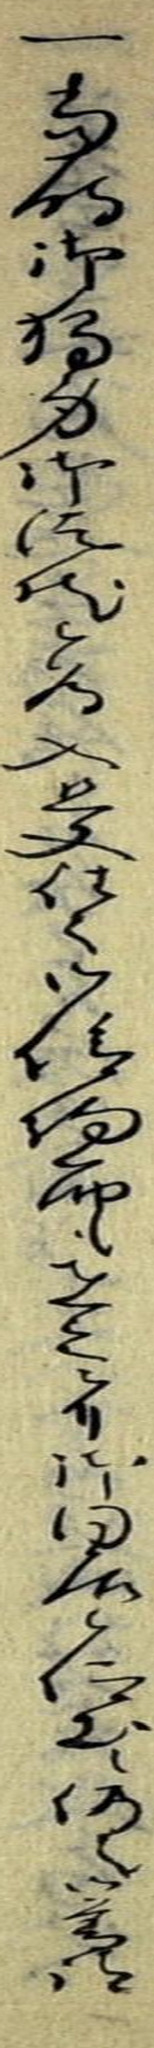一当時御独身御徒然被為入且又之御倹約筋も在之ニ付御同居被仰出候仍之御普請
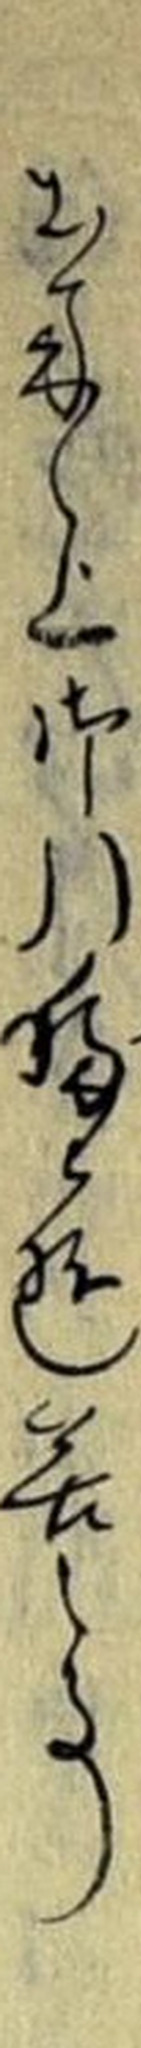出来候上御引移被遊筈候事
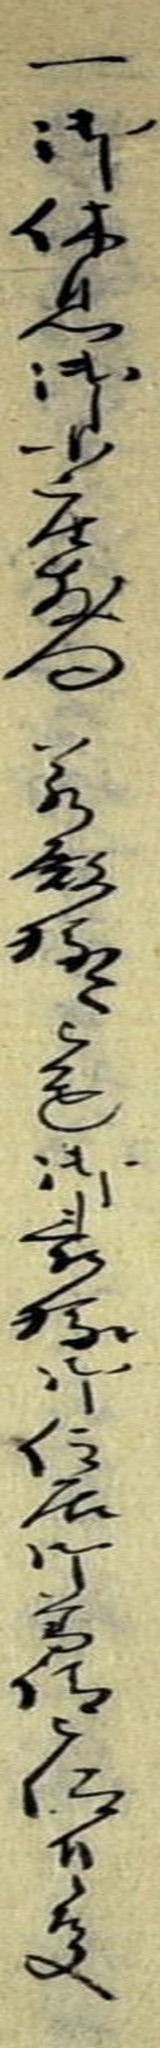一御休息御小座敷向若殿様へ被進御表様御住居御普請被仰付候事
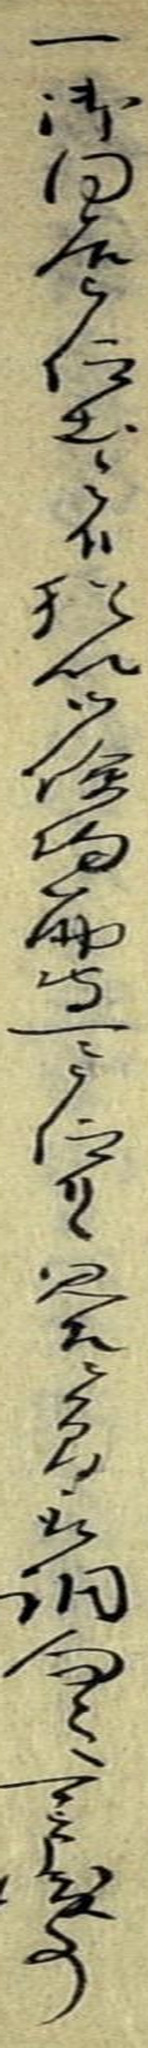一御同居被仰出候ニ付猶以御倹約筋専一ニ被仰付候思召ニ候間取調向々へ可被申渡事
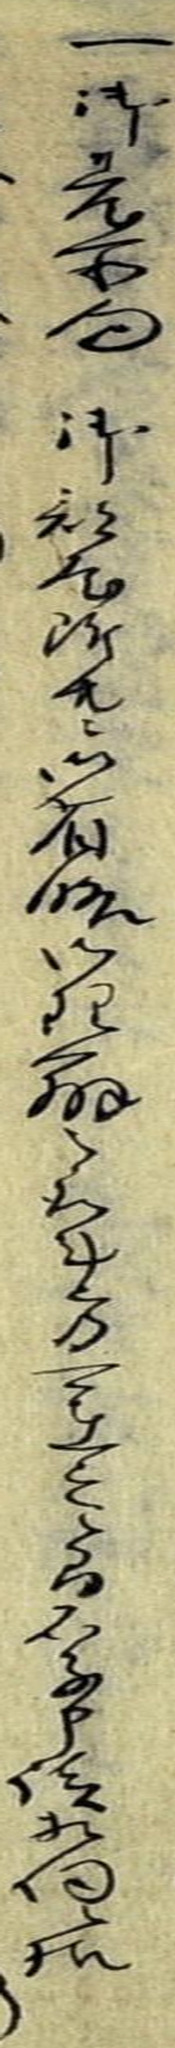一御台所向御部屋付共ニ御省略御理弁之取計方可在之候間厚申談相伺候様事
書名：命令之部 三
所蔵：福井県文書館 Fukui Prefectural Archives
